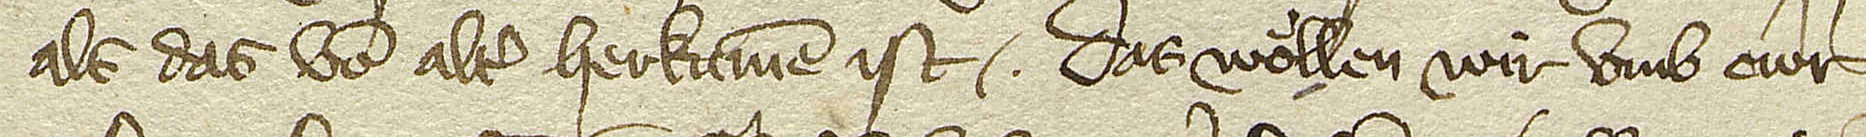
als das vo* alt* herkume* iſt / . Das wöllen wir vmb ewr
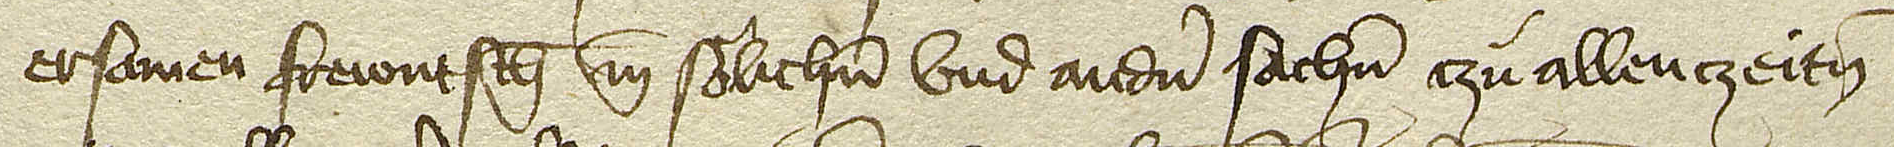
erſamen frewntſch* in ſölichn* vnd andn* ſachn* cʒü allencʒeitn*
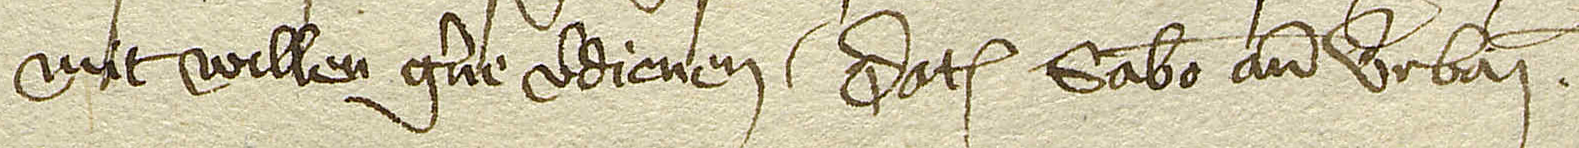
mit willen g*ne v*dienen / Dat* Sabo* an* Vrbai* .
